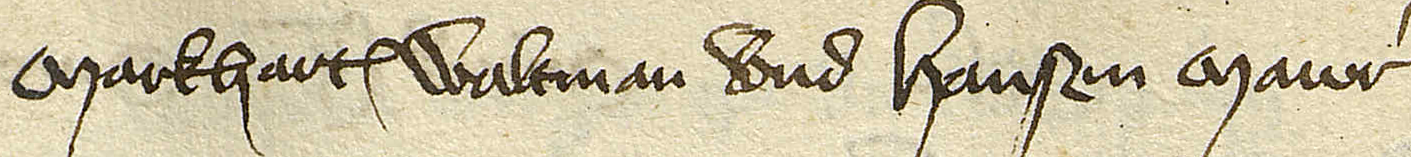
Markhart* Waltman vnd hanſen Mawr*
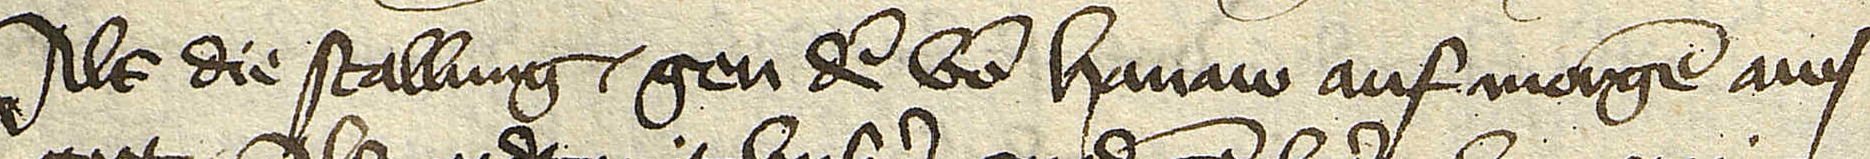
Als die ſtallung / gen d* vo* hanaw auf morge* awſ
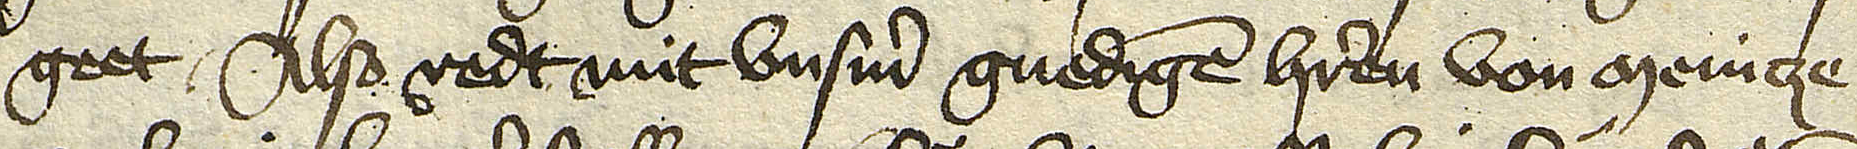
geet / Alſo redt mit vnſm* gnedige* hr*en von Meincʒe
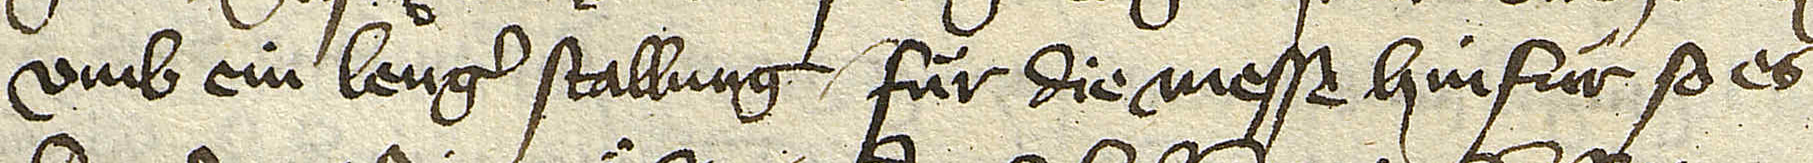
vmb ein leng* ſtallung / für die meſſe hinfür ſo es
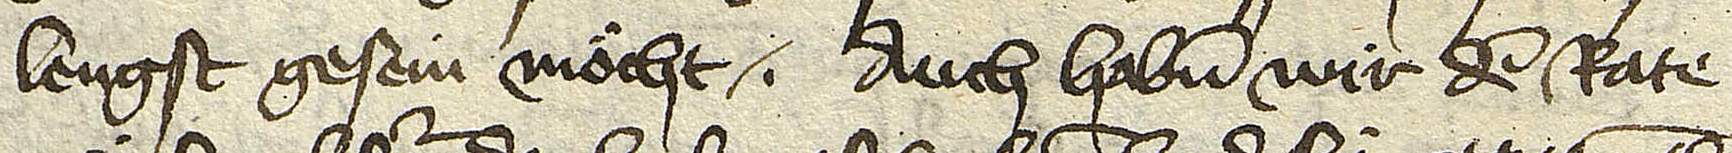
lengſt geſein möcht / . Auch habn* wir d* Rate
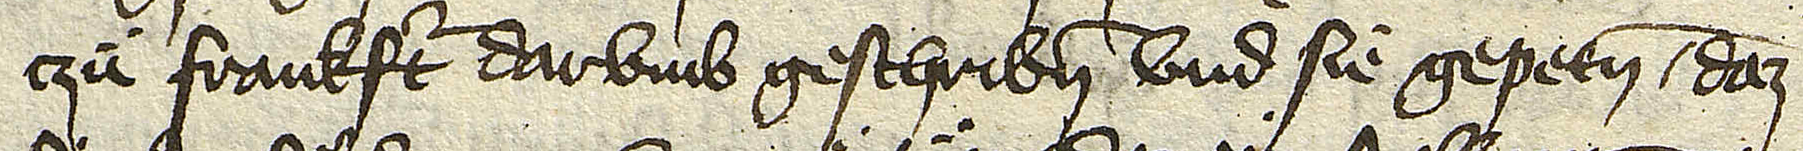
cʒü frankft* darvmb geſchribn* vnd ſie gepetn* / daʒ
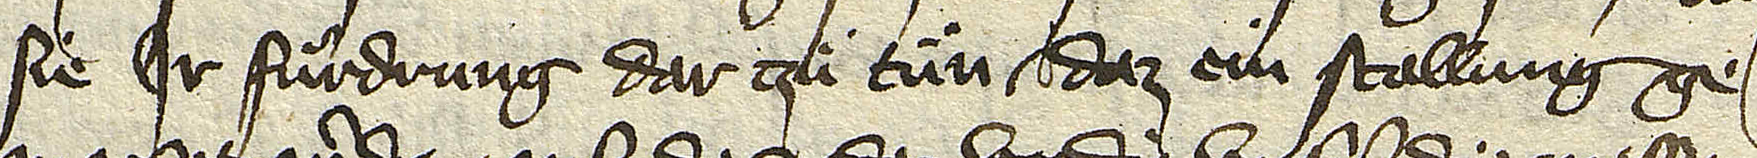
ſie Ir fürdrung dar cʒü tün / daʒ ein ſtallung ge
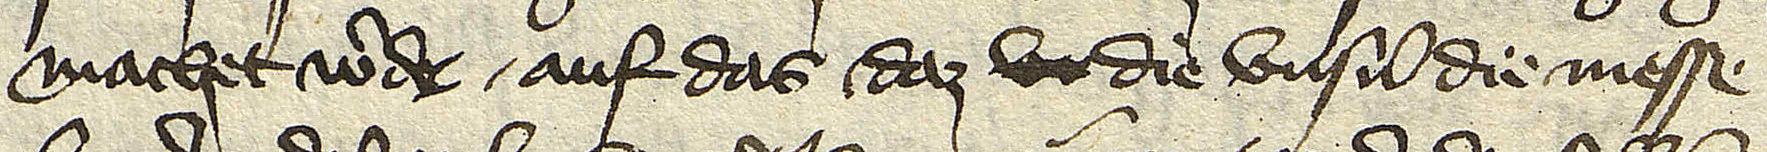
machet w*de / auf das / daʒ vn die vnſn* die meſſe
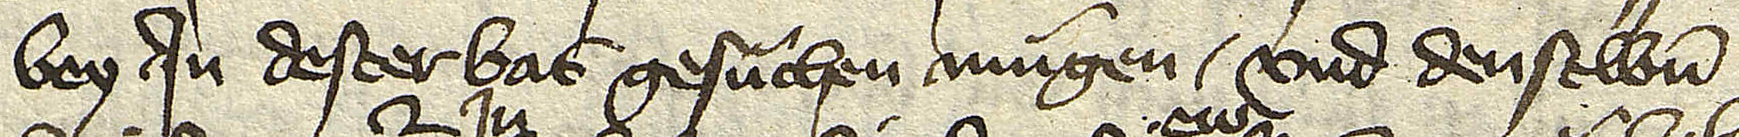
bey In deſtervas geſüchen mugen / vnd denſelbn*
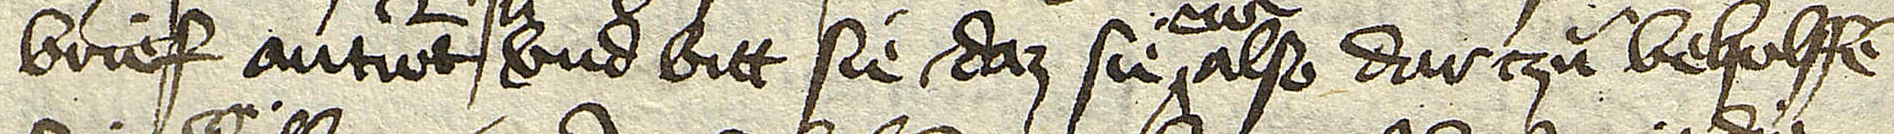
brief antwt* vnd bitt ſie / daʒ ſie alſo darcʒü beholffe*
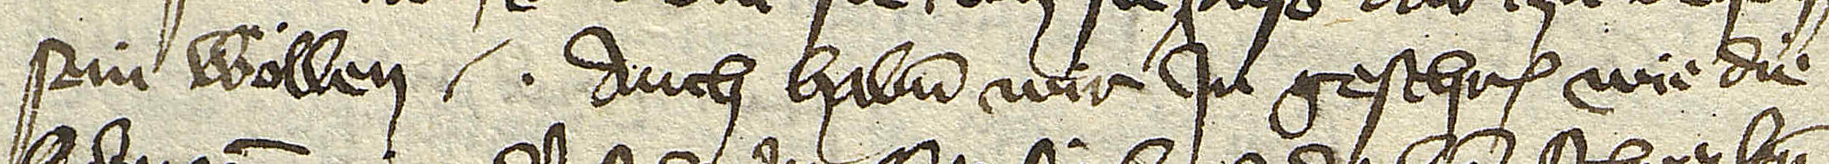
ſein wöllen / . Auch habn* wir In geſchr* wie die
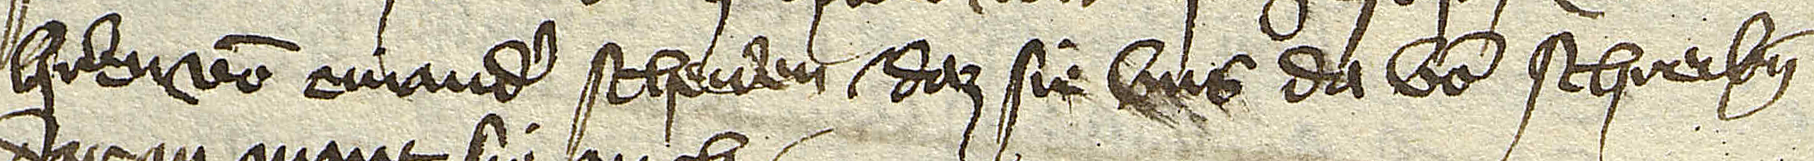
hr*en vo* einand* ſcheiden / daʒ ſie vns da vo* ſchreibn*
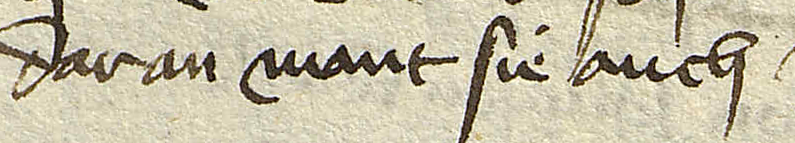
daran mant ſie auch /
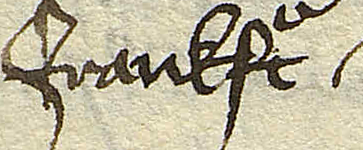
Frankft* /
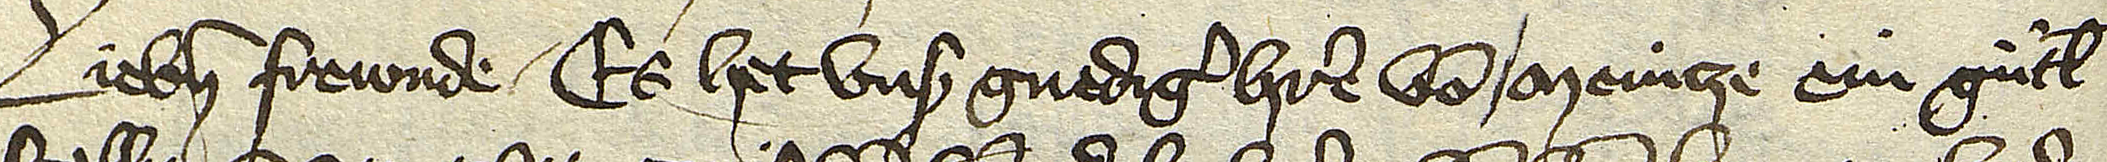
Liebn* frewnde / Es het vnſ* gnedig* hr*e vo* Meincʒe ein gütl*
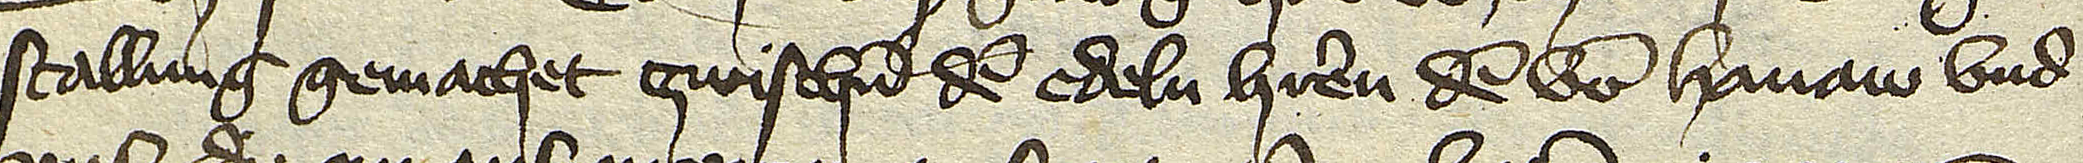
ſtallung gemachet cʒwiſchn* d* edeln hr*en d* vo* hanaw vnd
